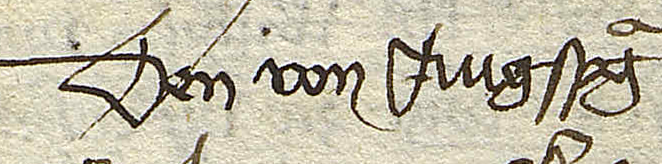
Den von Augſp*g
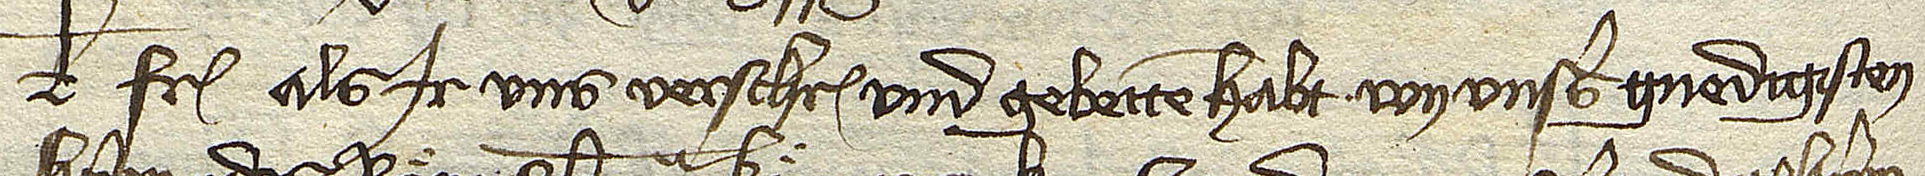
L* fr* als Ir vns verſchr* vnd gebette* habt . von vnſ*s gnedigiſten
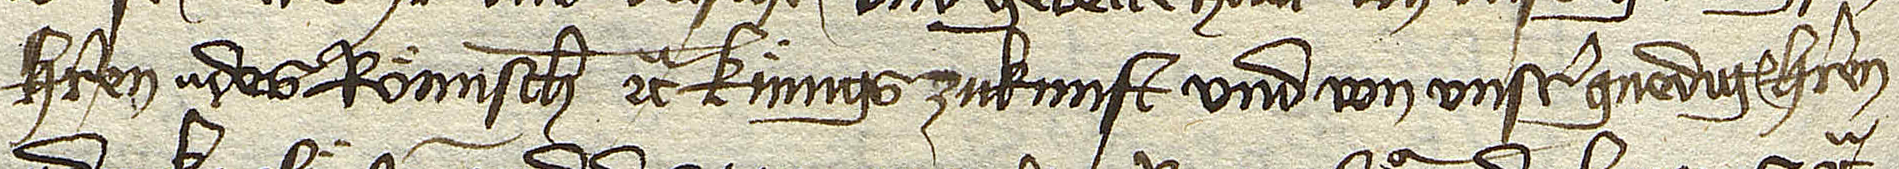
h*ren ~ des Römiſch* ec* künigs ʒukunft vnd von vnſ*r gnedig* h*ren
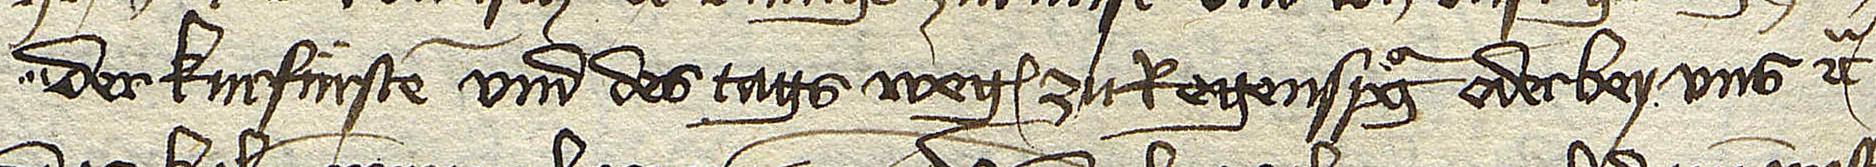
~ der kurfürſte* vnd des tags weg* ʒu Regenſp*g oder bey vns ec*
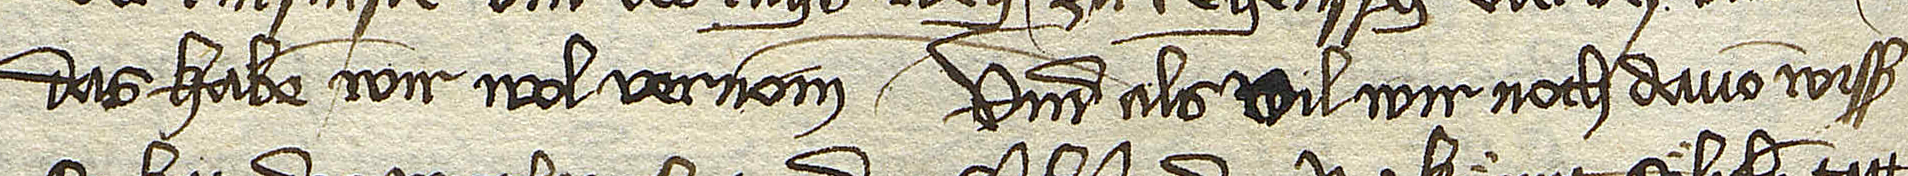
das habe* wir wol vernom* / Vnd als vil wir noch dauo* wiſſ*
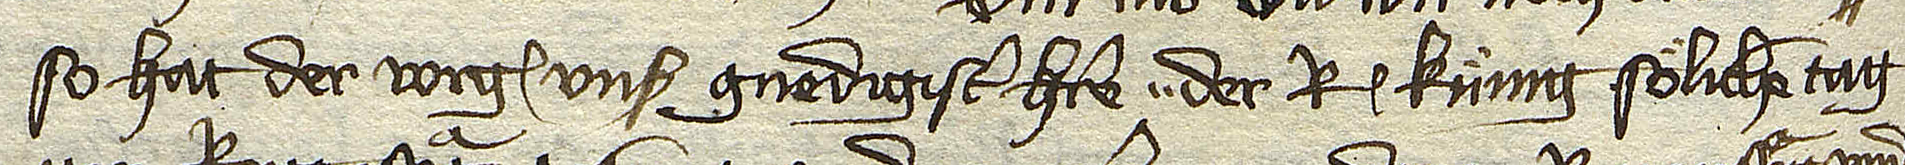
ſo hat der vorg* vnſ* gnedigiſt* h*re ~ der R* künig ſöliche* tag
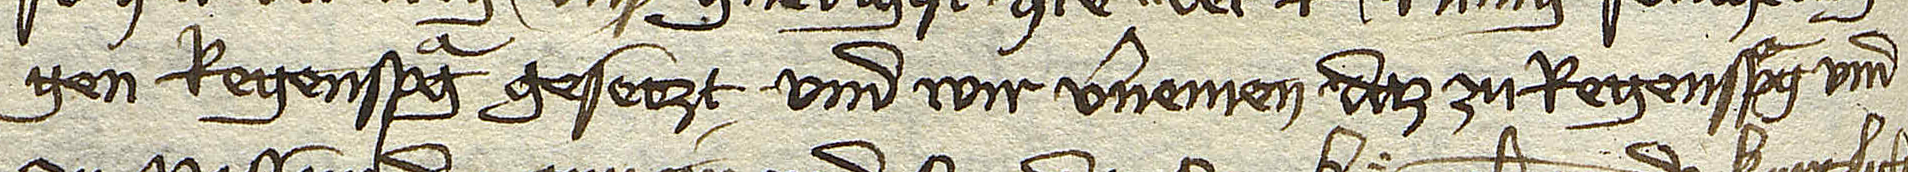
gen Regenſp*g geſecʒt vnd wir v*nemen daʒ ʒu Regenſp*g vnd
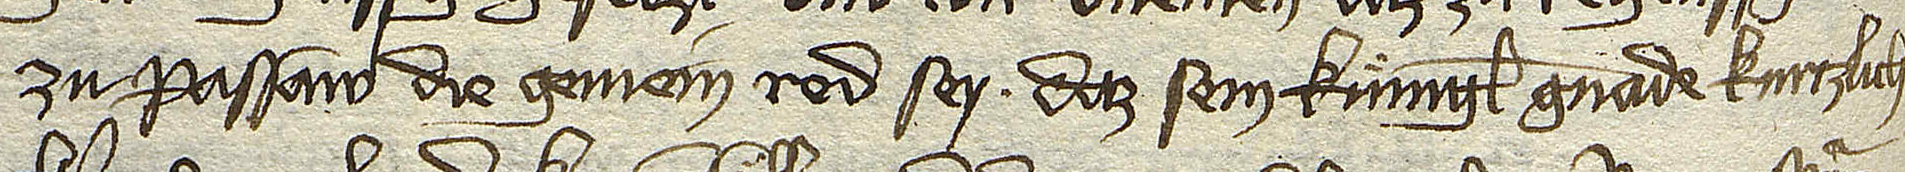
ʒu Paſſaw die gemein red ſey . daʒ ſein künigl* gnade kurcʒlich
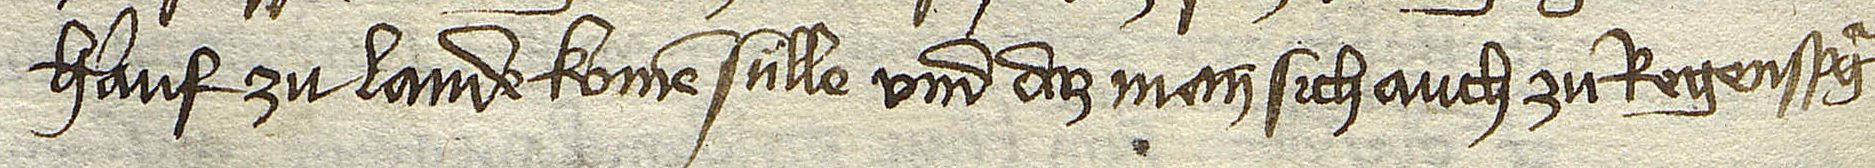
h*auf ʒu lande kome* ſülle vnd daʒ man ſich auch ʒu Regenſp*g
